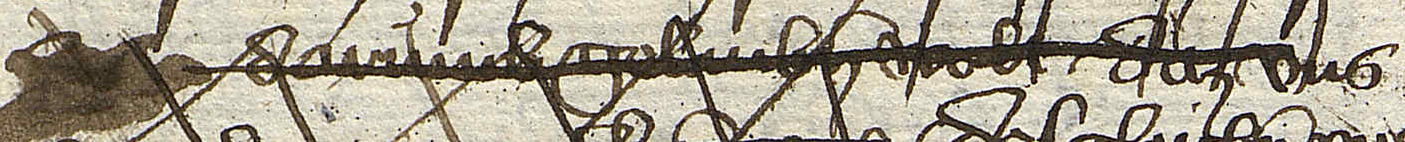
%%%% darümb gelaubn* wolt / daʒ vns
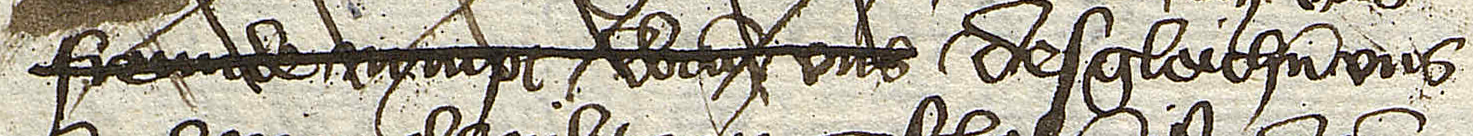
fremde nympt / wan* vns / Deſgleichn* vns
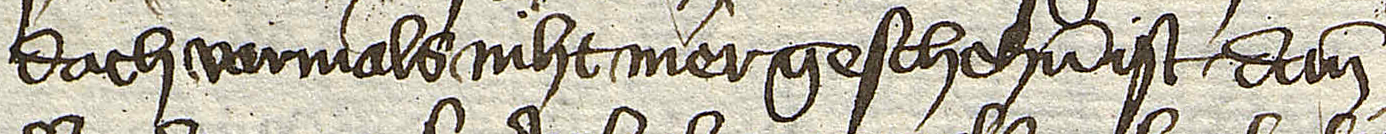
doch vormals niht mer geſchehn* iſt / dan*
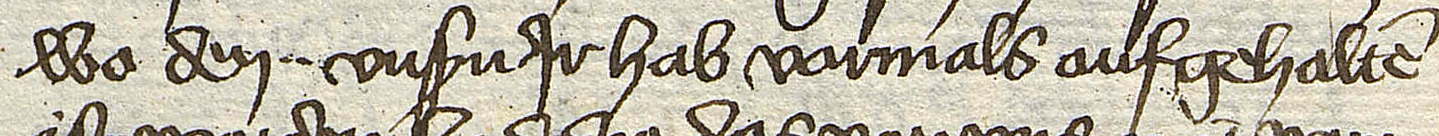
wo den ~ vnſ*n Ir hab vormals aufgehalte*
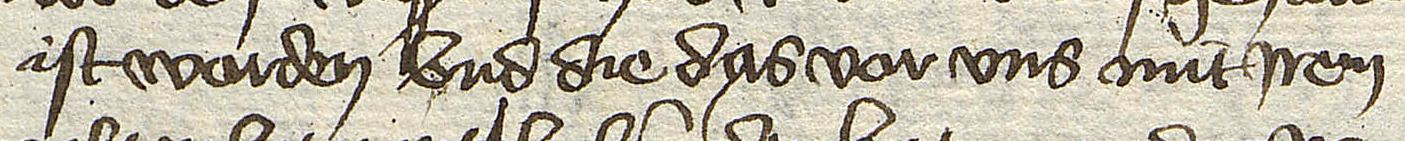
iſt worden vnd die das vor vns mit Irem
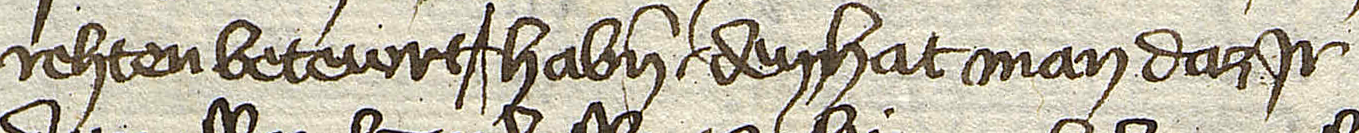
rehten betewrt habn* / den hat man daʒ Ir
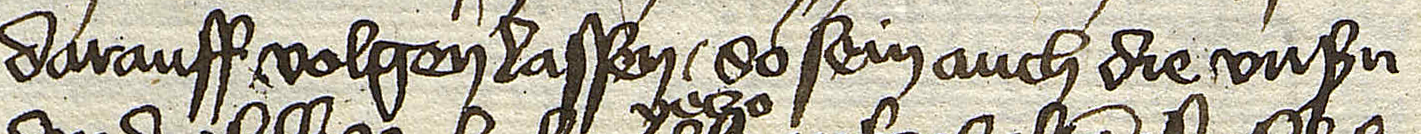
darauff volgen laſſen / So ſein auch die vnſ*n
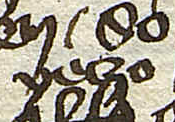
yecʒo
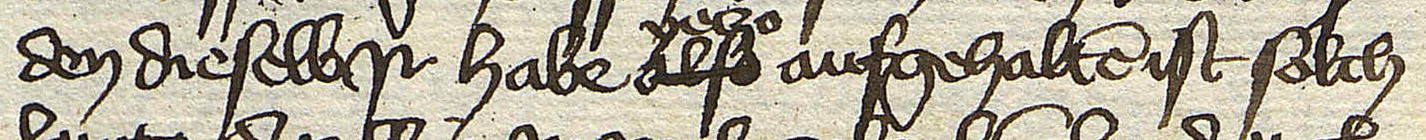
den dieſelb Ir habe alſo aufgehalte* iſt ſölch
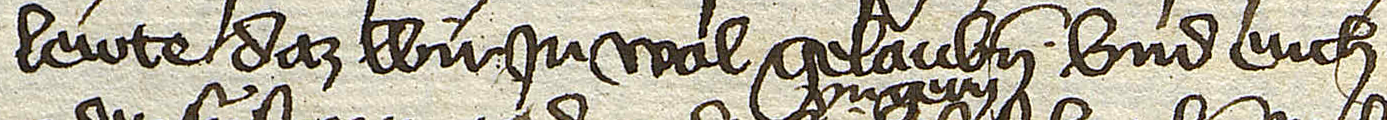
lewte / daʒ wir In wol gelaubn* . vnd euch
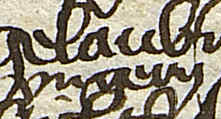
vngern
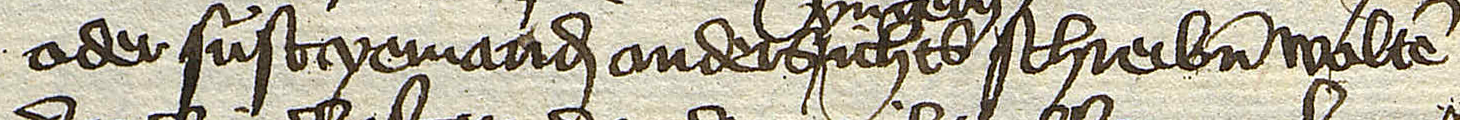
oder ſüſt yemand* anders ichts ſchreibn* wolte*
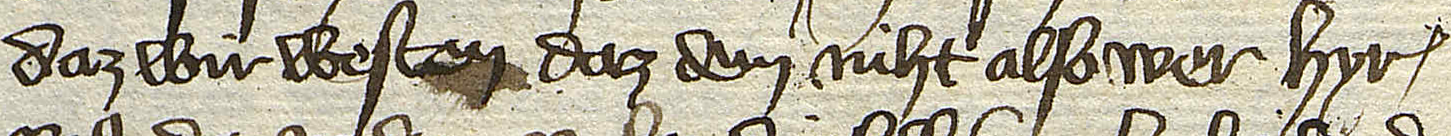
daʒ wir weſten daʒ dem niht alſo wer hyr*
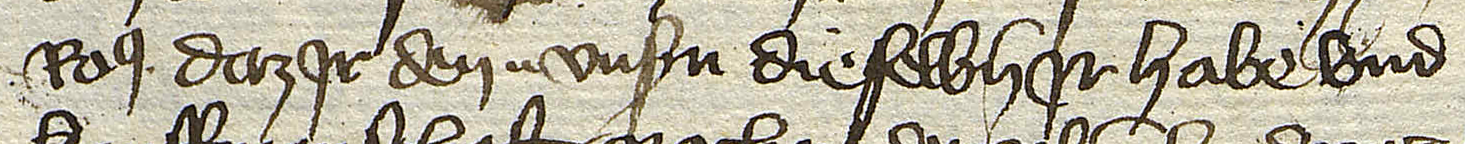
Ro* . daʒ Ir den ~ vnſ*n dieſelbn* Ir habe vnd
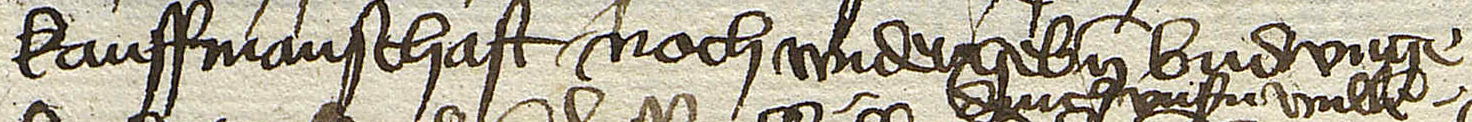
kauffmanſchaft / noch widergebn* vnd vnge
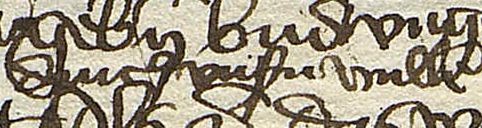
durch vnſ*n wille*
